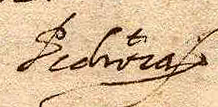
Pedroza
